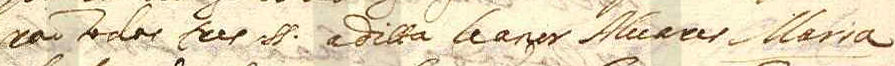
raõ todas tres .ss. a ditta Leanor Aluares Maria
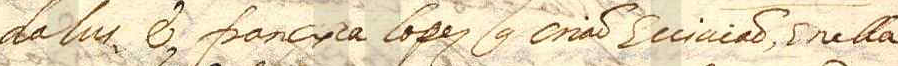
da Lus, & Francisca Lopez q̄ criaõ E uiuiaõ, E nella
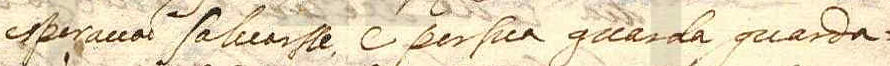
esperauaõ saluarsse, e per sua guarda guarda
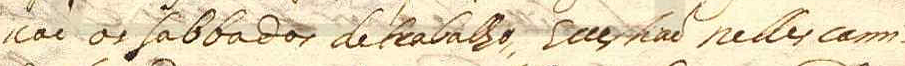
uaõ os sabbados de trabalho, E uestiaõ nelles cami
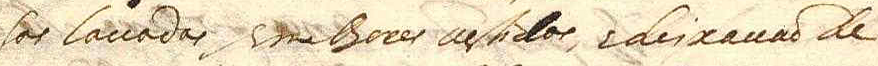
sas lauadas, E melhores uestidos, E deixauaõ de
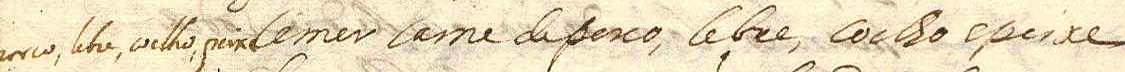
Comer carne de porco, lebre, coelho E peixe
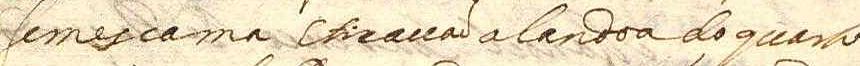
sem escama E tirauaõ a landoa do quarto
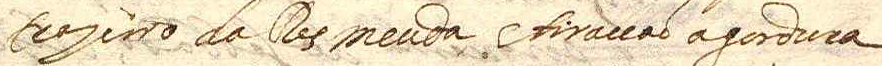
trazeiro da Res meuda, e tirauaõ a gordura
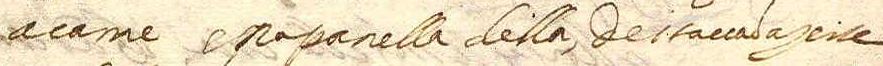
a carne e na panella della, deitauaõ azeite
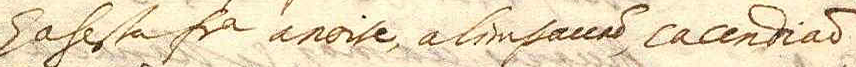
E a sesta fra a noite, a limpauaõ, e acendiaõ
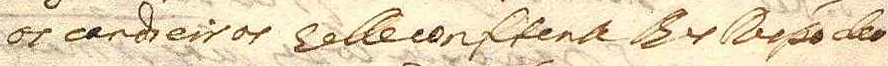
os candieiros E elle confitente lhes Respōdeo
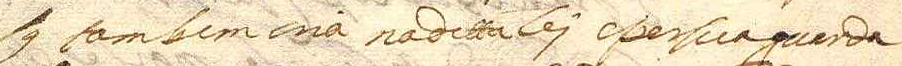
q̄ tambem cria na ditta lej e per sua guarda
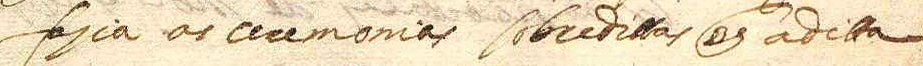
fazia as ceremonias sobredittas o q̄ a ditta
